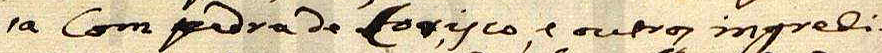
sa Com pedra de Corisco, e outros ingredi
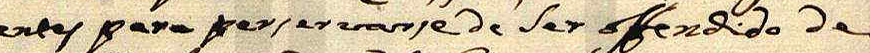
entes para perseruarse de ser offendido de
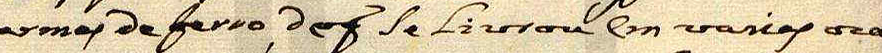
armas de ferro, de q̄ se livrou em varias oca
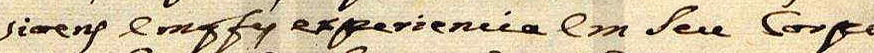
sioens em q̄ fes experiencia em Seu Corpo
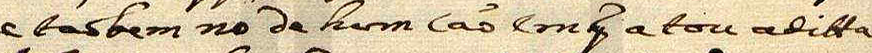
e taõbem no de hum caõ em q̄ atou a ditta
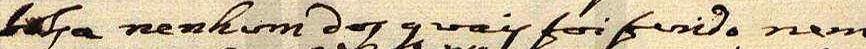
bolsa nenhum dos quais foi ferido, nem
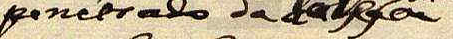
penetrado da __l_sa
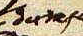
duresa
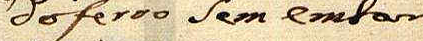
do ferro sem embar
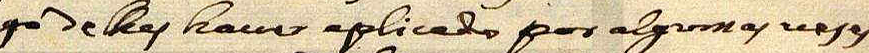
go de lhes hauer aplicado por algumas ueses
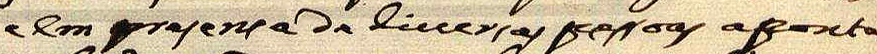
e em presensa de diuersas pessoas a ponta
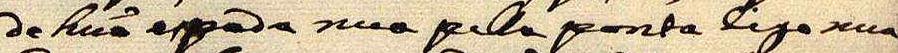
de huā espada nua pella ponta digo nua
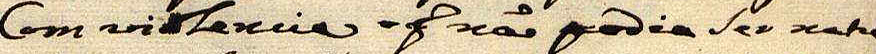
Com violencia, o q̄ naõ podia ser natu
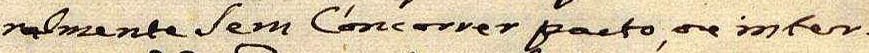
ralmente sem Concorrer pacto, ou inter
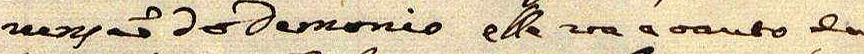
uensaõ do demonio elle va ao auto da
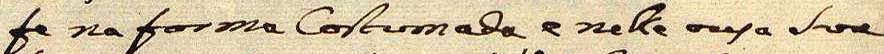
fe na forma Costumada, e nelle ousa sua
